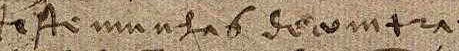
testemunhas de comtra
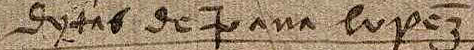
dytas de Joana lopez
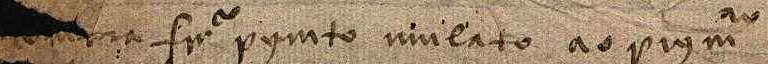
comtra fraco pymto mulato ao prymro
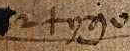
rtygo
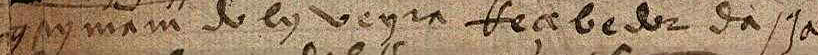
ꝯ symam dolyveyra Recebedor da / Ja
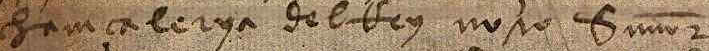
chamçalerya del Rey noso Snn̄or
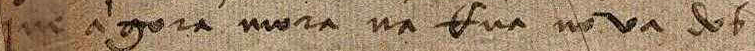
que agora mora na Rua nova dos
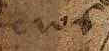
feros
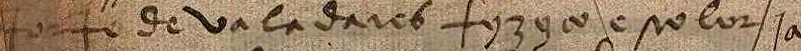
JorJe de Valadares fyzyco e solor / Ja
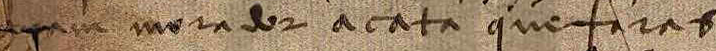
giam morador a cata que faras
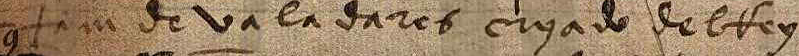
ꝯ Jam de Valadares cryado del Rey
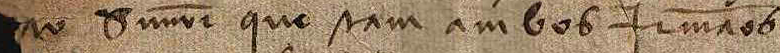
so Snn̄or que sam ambos Jrmãos
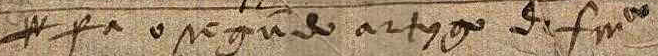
item ꝑa o segūdo artygo de fraco
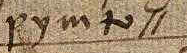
pymto //
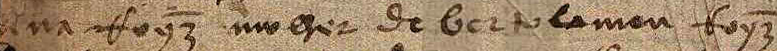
ana Royz̄ molher de bertolameu Roȳz
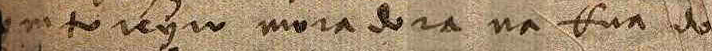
ymtoreyro moradora na Rua do
